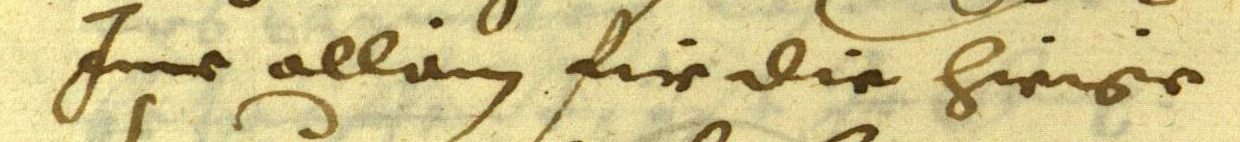Ime allain fir die hieige
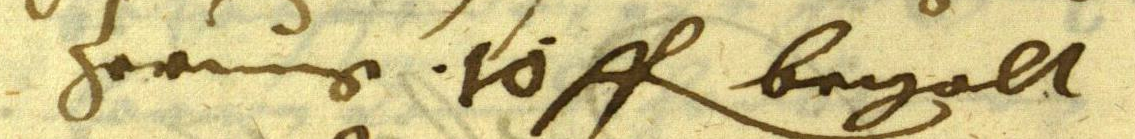Zerūng .10 fl bezalt
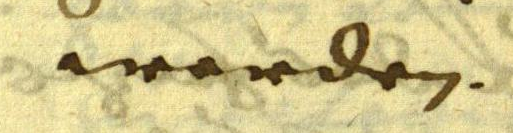werden.
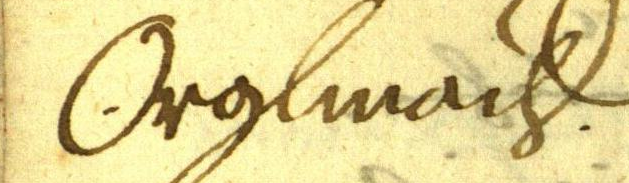Orglmach.
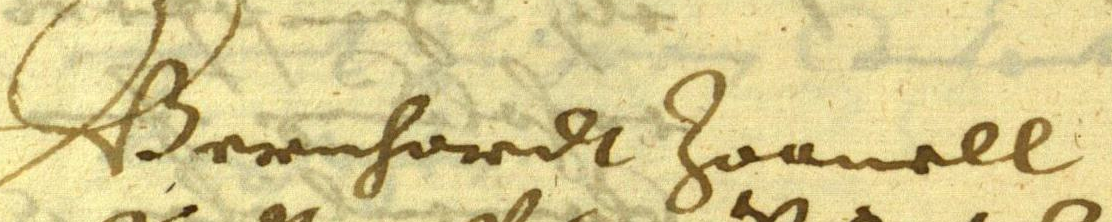Bernhardt Zoanell
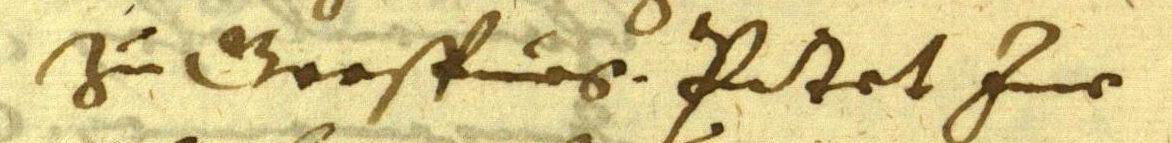Zū GersPūrg. Pitet Ime
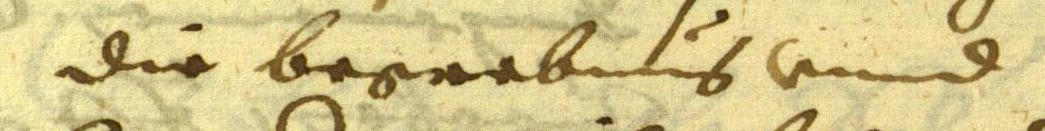die begrebūng vnnd
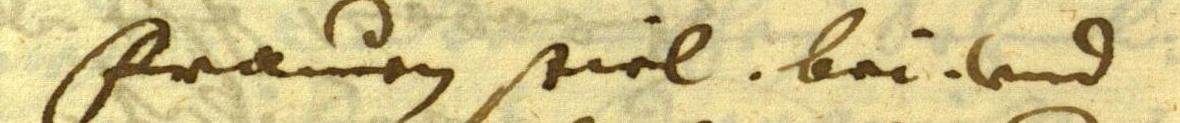Fraūen stiel. bei. vnd
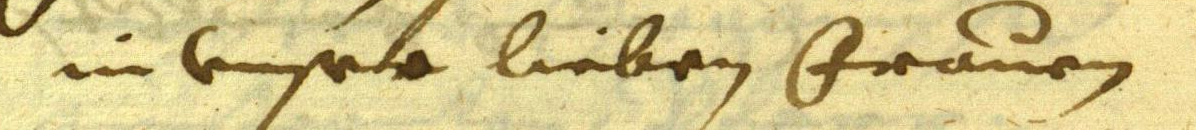in vnser lieben Fraūen
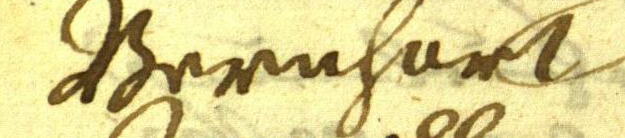Bernhart
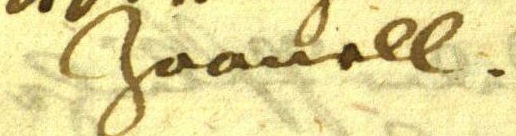Zoanell.
